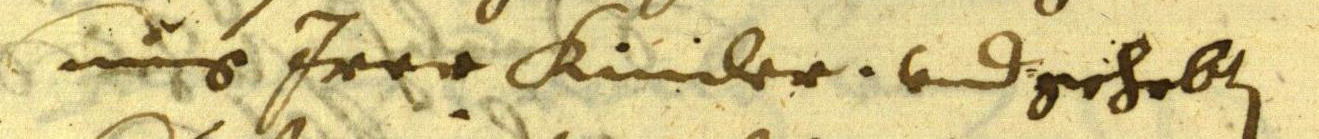ūng Irer Kinder. vnd gehabt
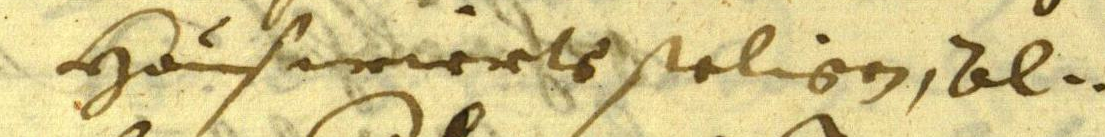Haūswierts seligen, Al¬
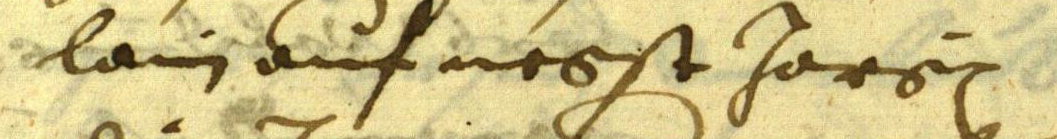lain aūf negst Jorgj
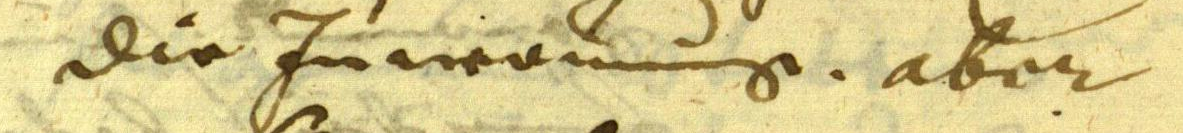die Inwonūng. aber
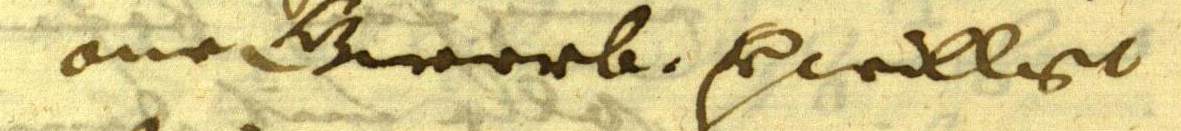one Gwerb. gewilligt
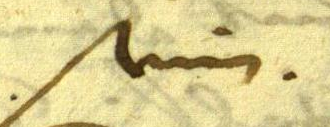sein.
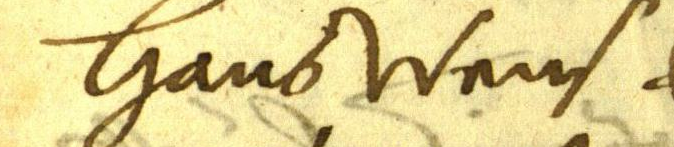Hans Wens¬
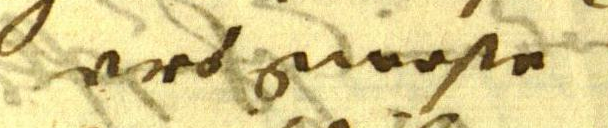ers gweste
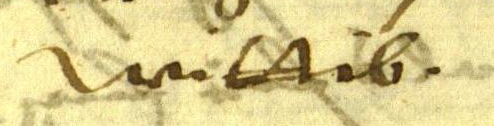Wittib.
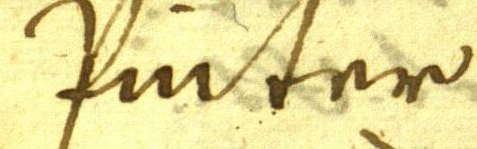Pinter.
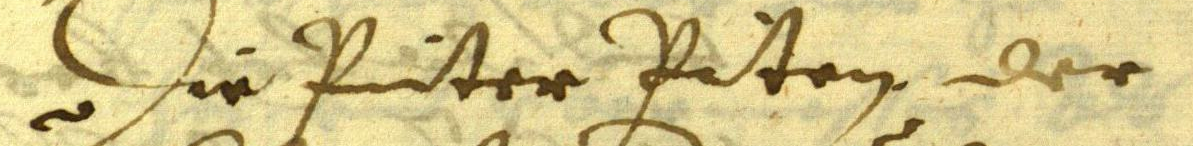Die Pinter Piten der
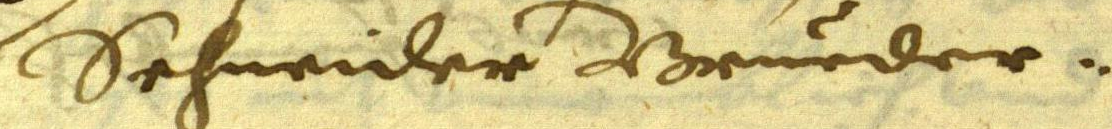Schneider Brūeder¬
